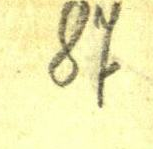87
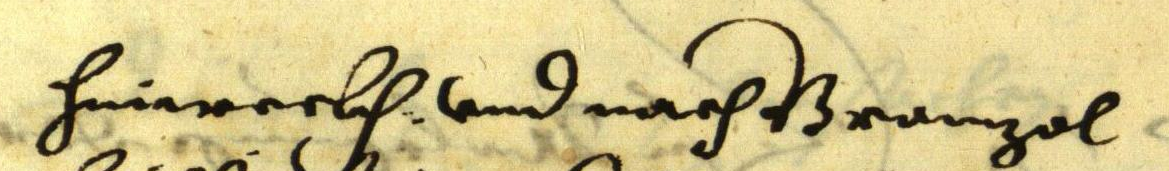hinweckh. vnd nach Branzol
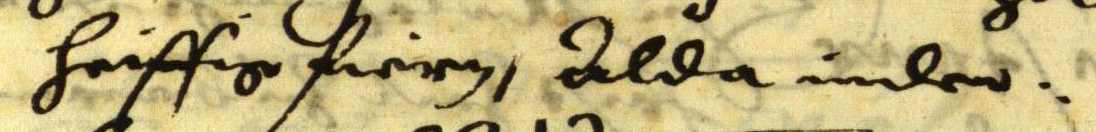heiffig fiern, Alda nider¬
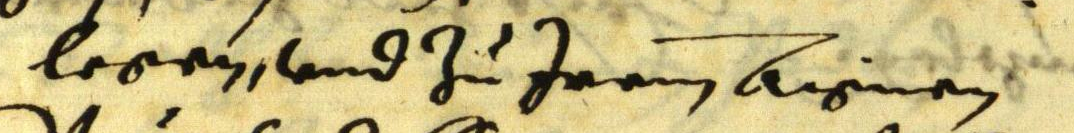legen, vnd Zū Irem Aignen
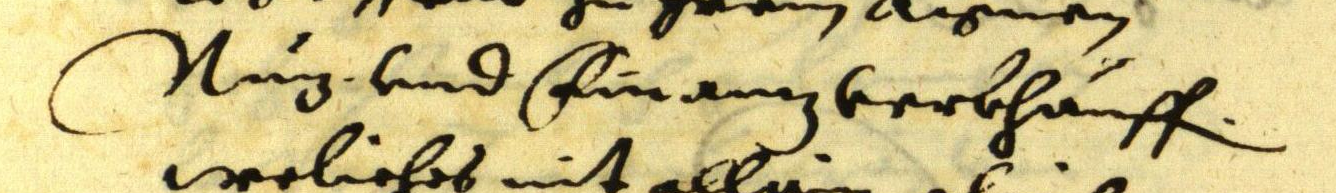Nūz. vnd Finanz verkhaūff.
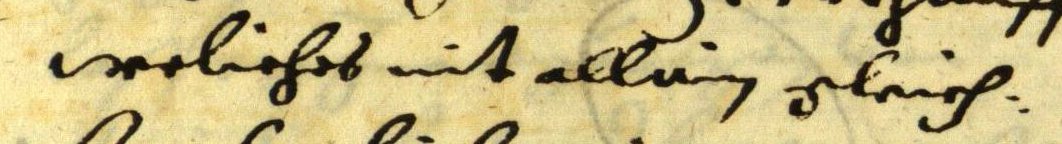weliches nit allain gleich¬
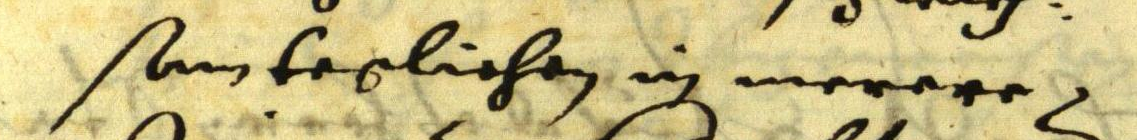sam teglichen in merere
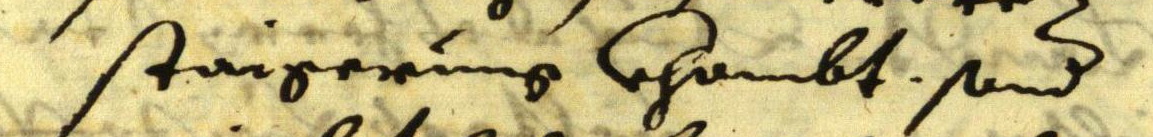staigerūng khombt. sond
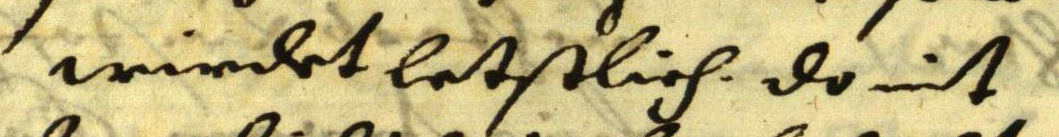wirdet letslich. da nit
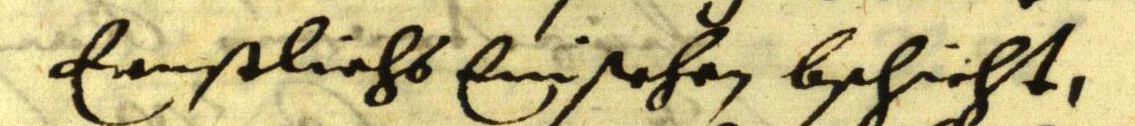Ernstlichs Einsehen bschieht,
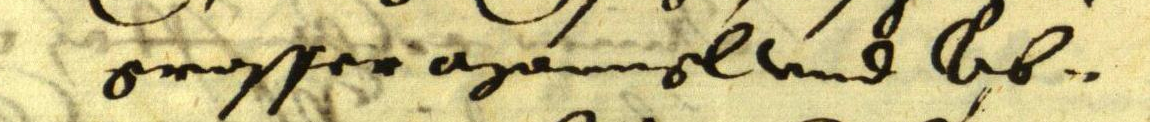grosser Manngl vnd Ab¬
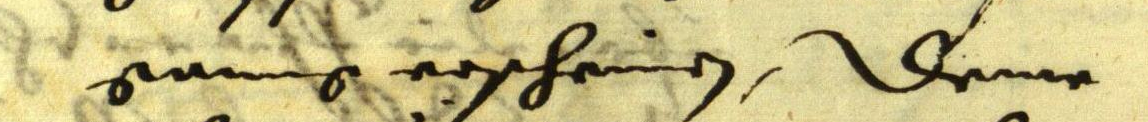ganng erscheinen, Deme
